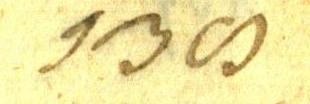138
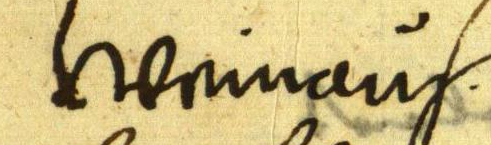Weinaūs¬
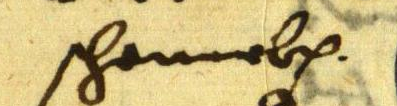schennckh.
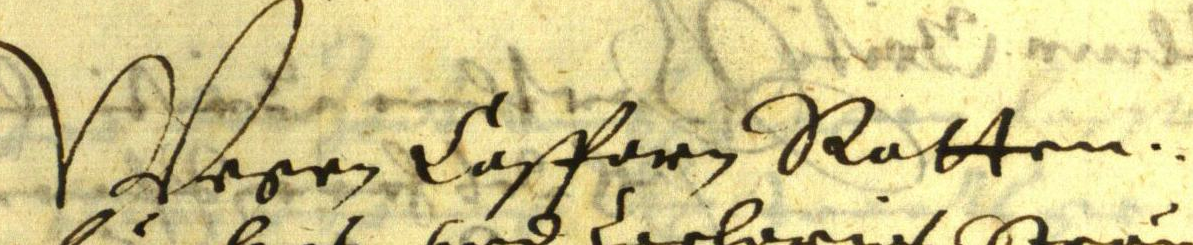Wegen Casparn Rotten¬
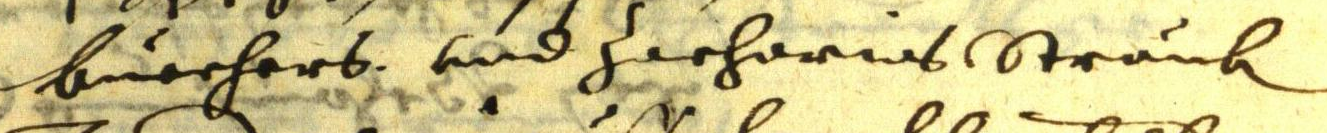būechers. vnd Zacharias Straūb
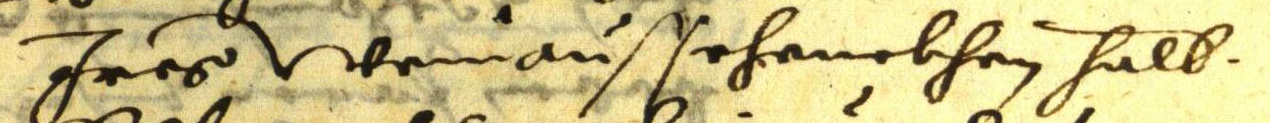Ires Weinaūsschenckhen halb.
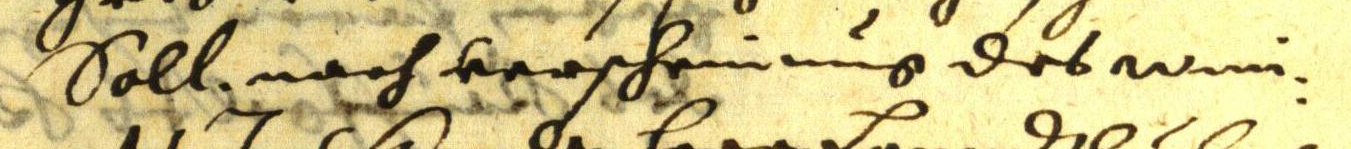Soll. nach verscheinūng des wim¬
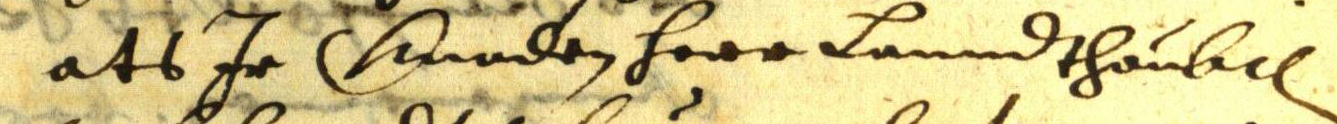ats Ir Gnaden herr Lanndthaūbt
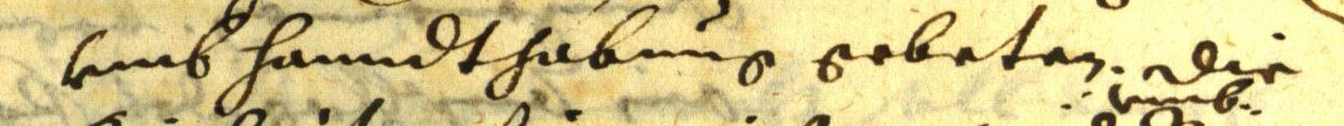vmb hanndthabūng gebeten. die
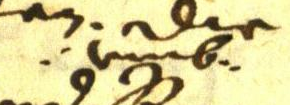:vmb:
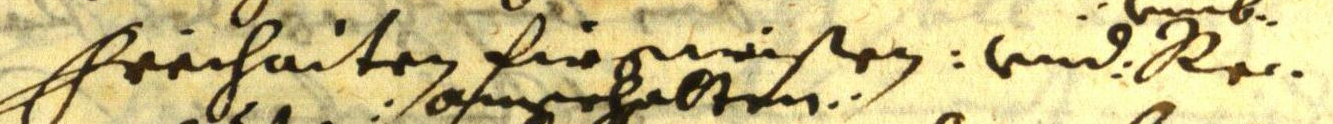Freihaiten fir gwisen :vnd: Re¬
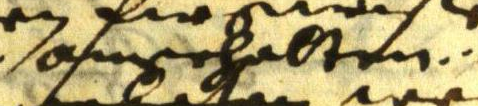:angehalten:
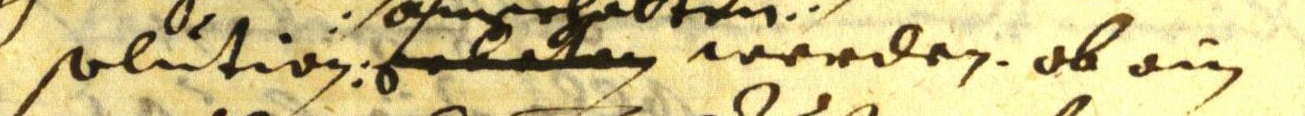solūtion: gehalten werden. ob ain
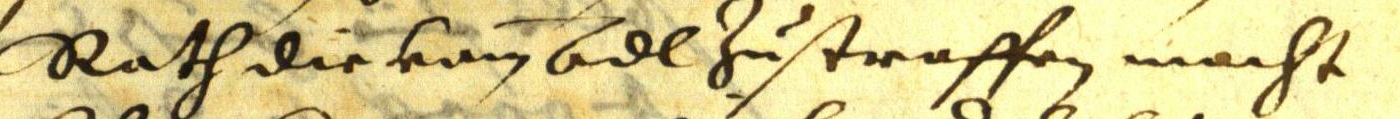Rath die vom Adl Zū straffen macht
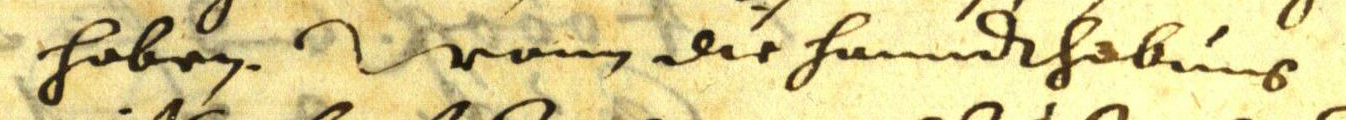haben. Wann die hanndthabūng
